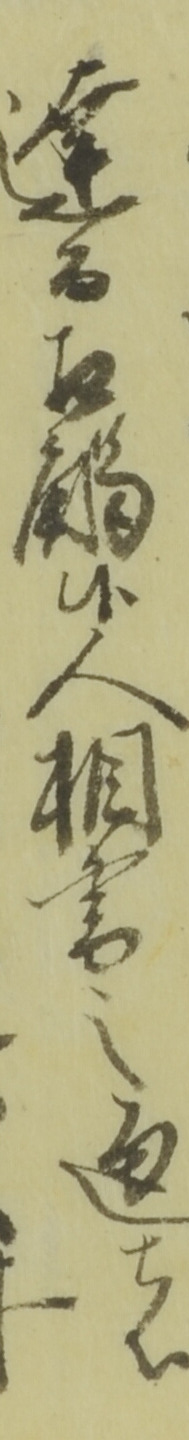達而相触候人相書之通は
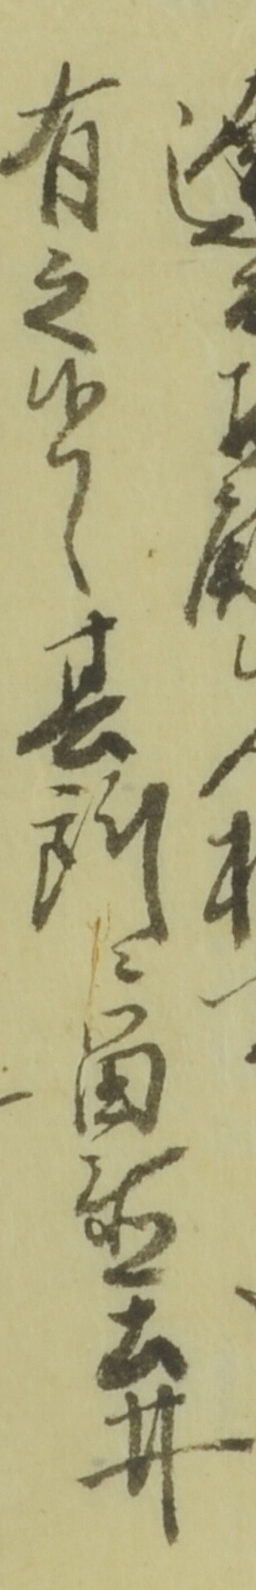有之候ハヽ其所ニ留置土井
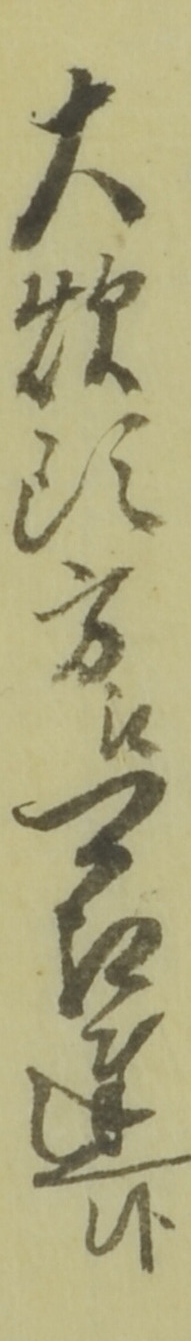大炊頭方江可相達候
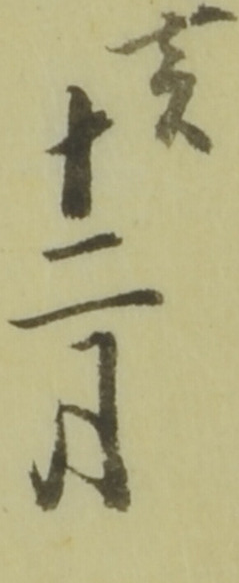十二月
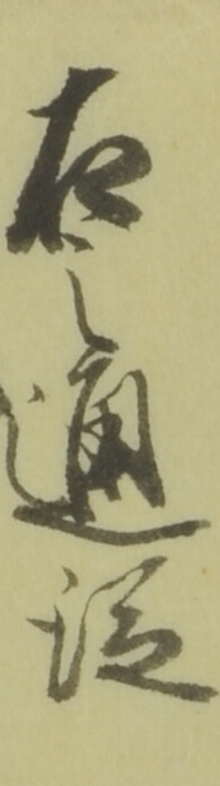右之通従
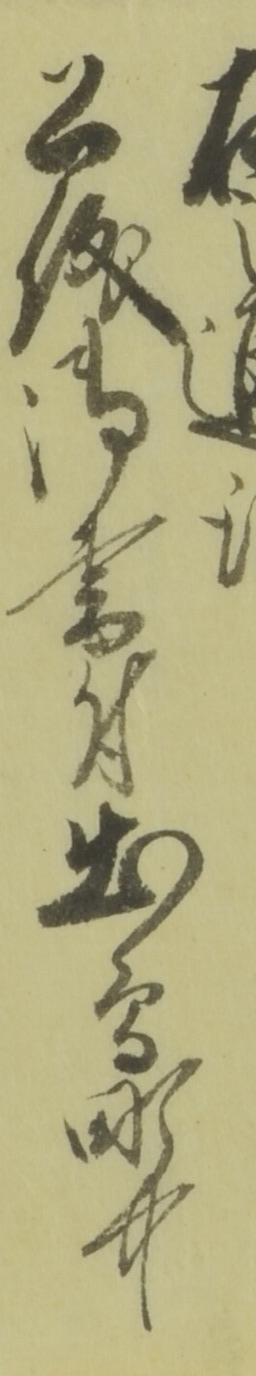公儀御書付出候間町中
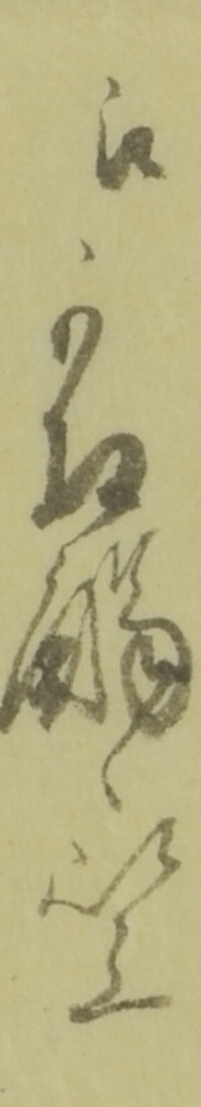江可相触候以上
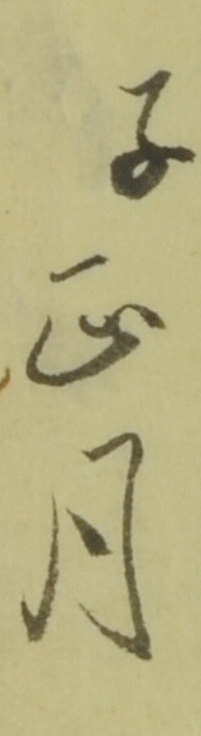子正月

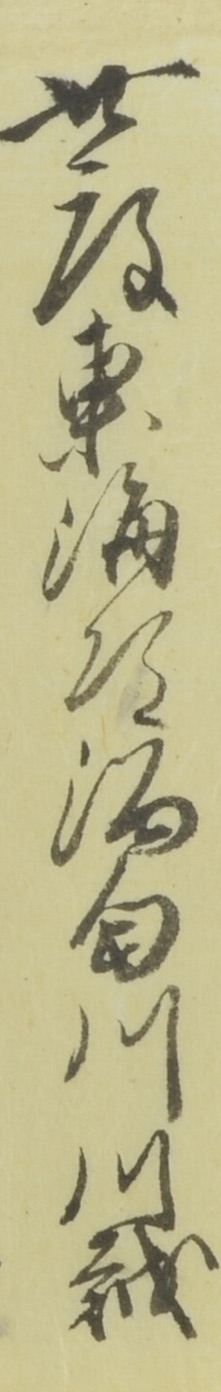此度東海道酒匂川川越
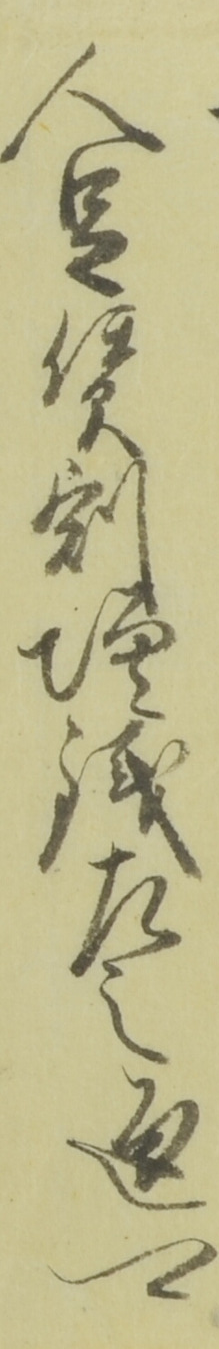人足賃割増銭左之通可
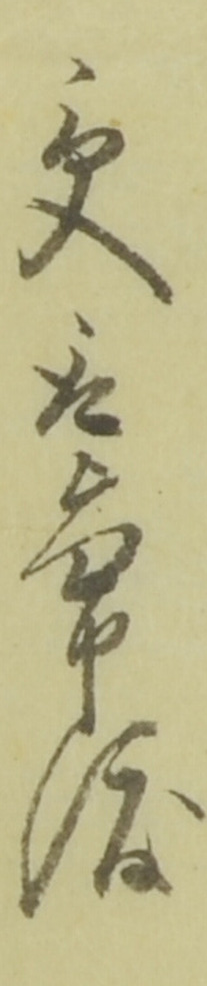受取旨申渡
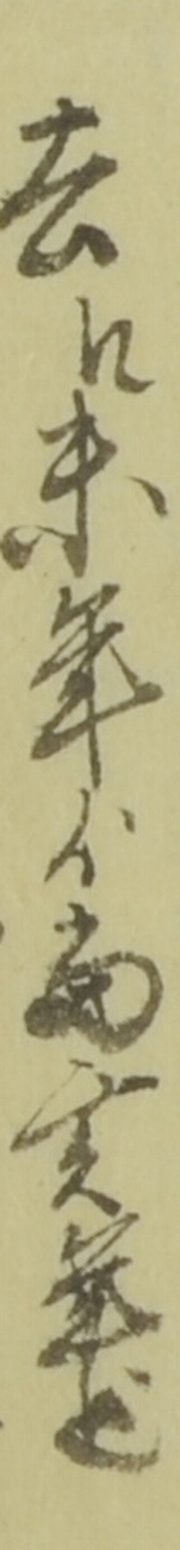去ル未年ゟ当亥年迄
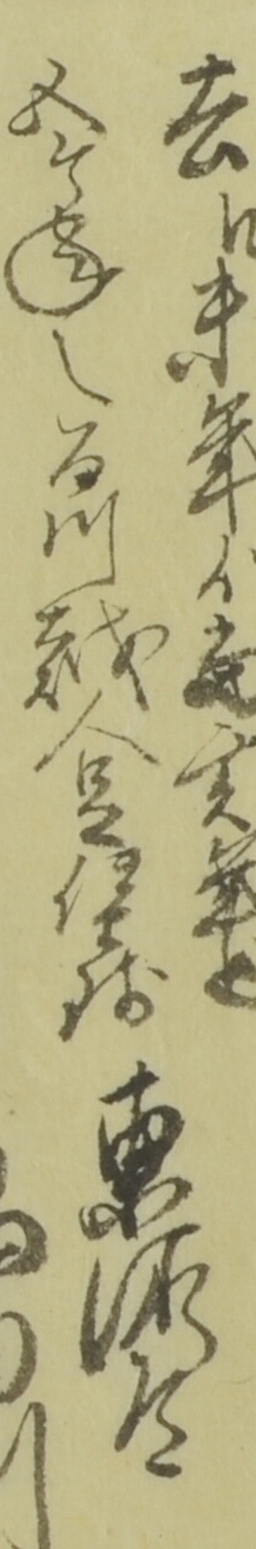五ヶ年之間川越人足賃銭東海道
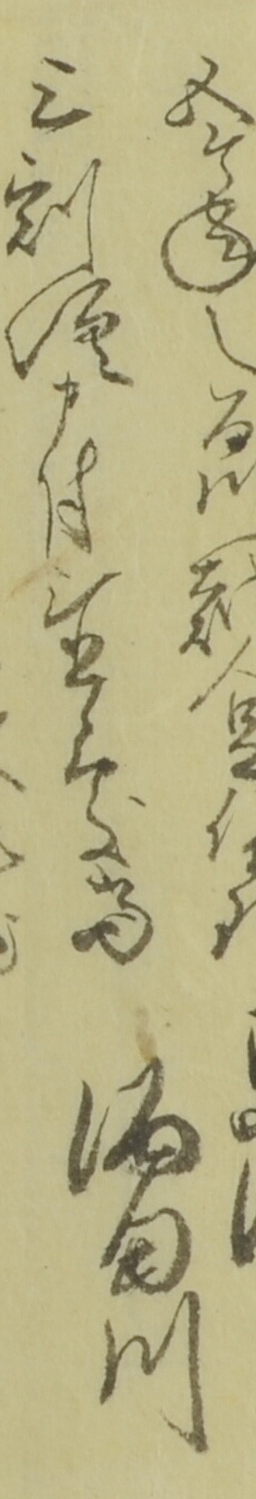三割増申付置処当酒匂川
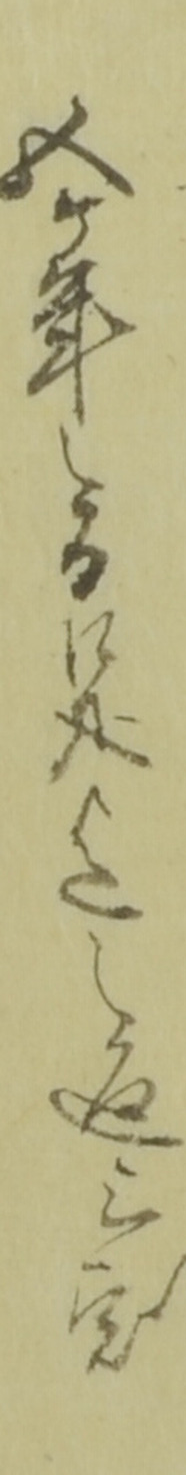五ヶ年之旨足迄之通三割
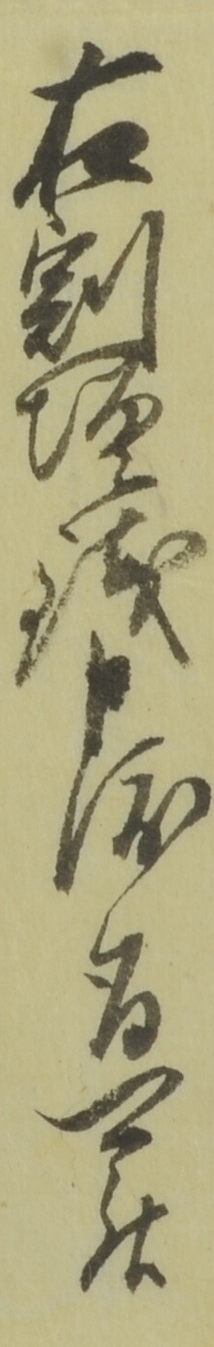右割増銭申渡旨可被
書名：御触書御書附控
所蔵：伊那市立高遠町図書館・合同会社AMANE
